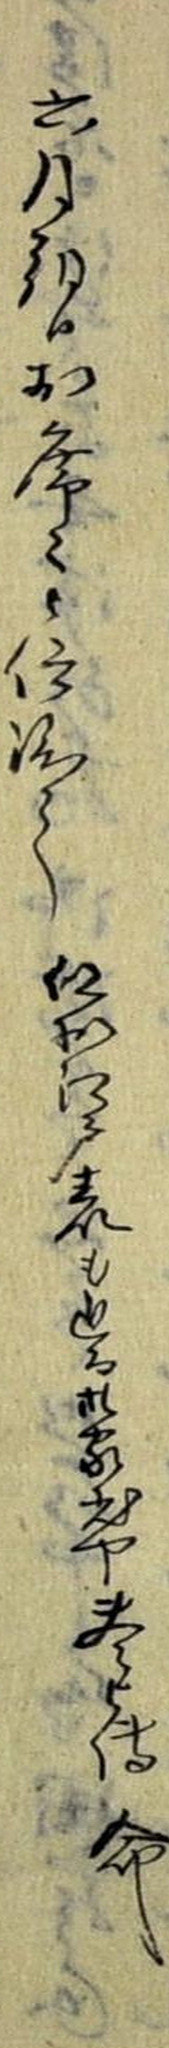六月朔日於席々被仰渡之但江戸表も追而御家老中夫々被伝命
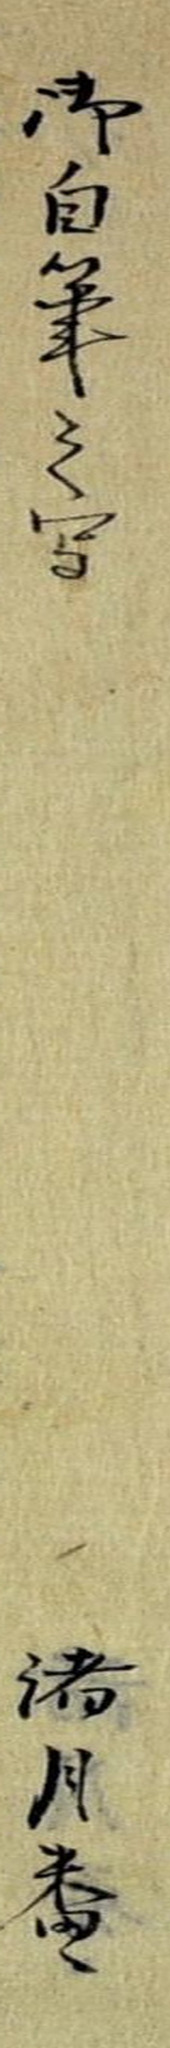御自筆之写諸月番へ
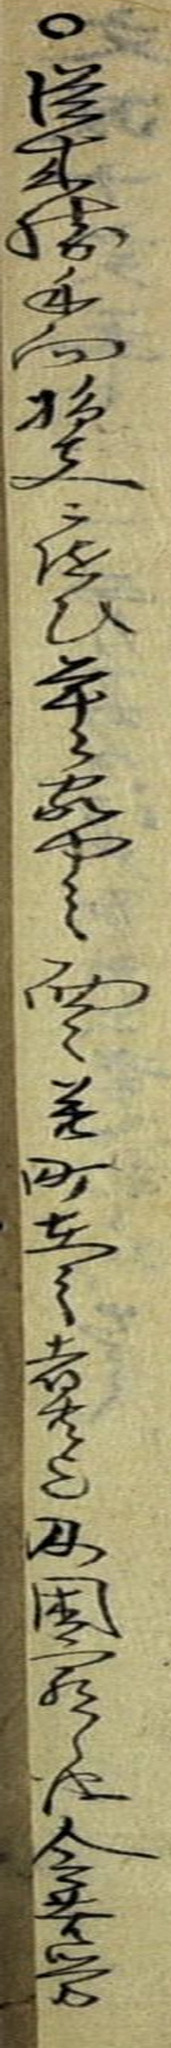○従来勝手向指支ニ随ひ年々家中之面々并町在之者共迄及困窮之儀令苦労
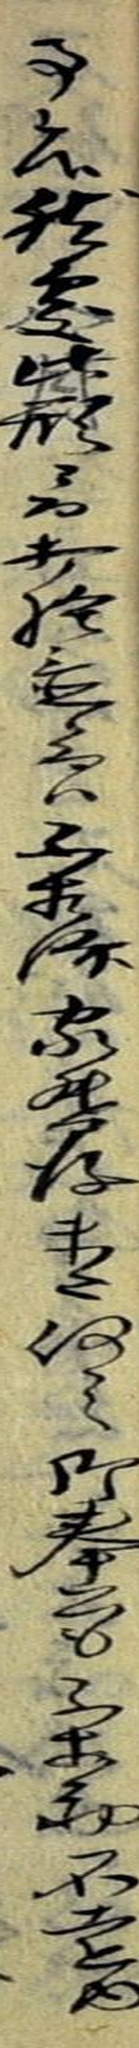事ニ候然処此形ニ而打捨置候而ハ不相済家督後末々何之御奉公も不相勤不遠内
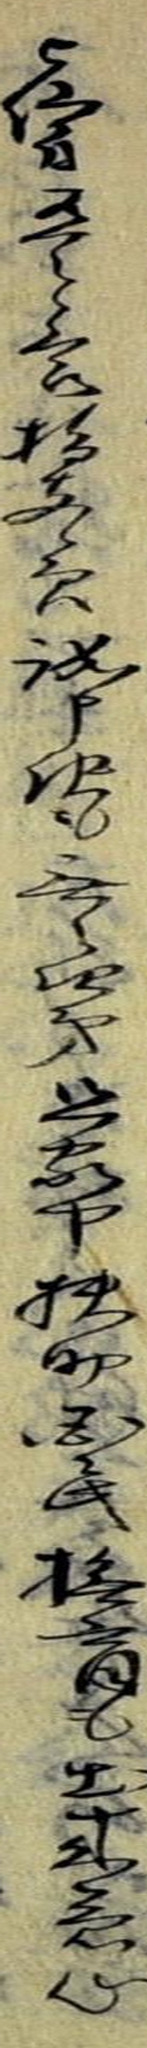被仰付有之候節差支候而ハ誠申訳も無之次第且家中扶助国民撫育も出来兼心
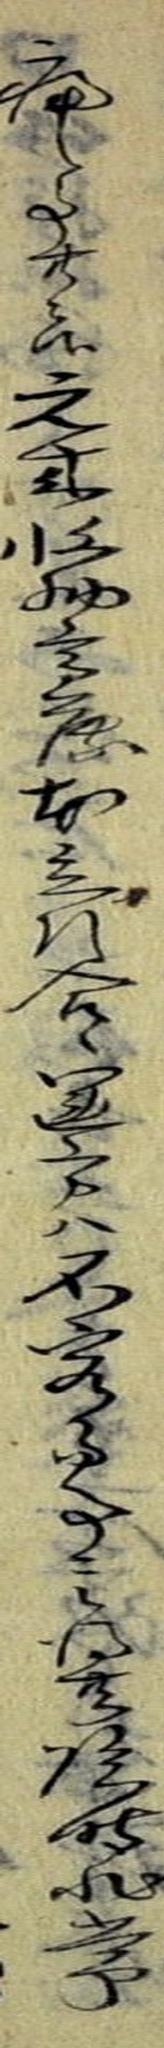痛之事共ニ候元来収納高薄本立引合之運方ハ不容易二候得共臨時非常
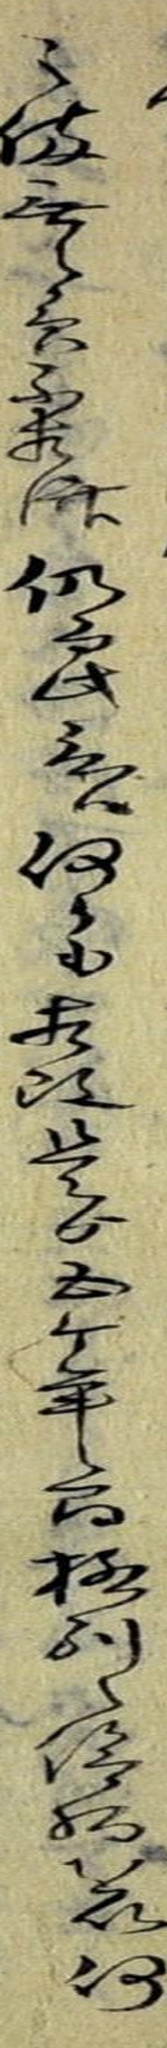之備無之候而ハ不相済仍而此度ハ何りも相改是ゟ五ヶ年之間格別之倹約を以何
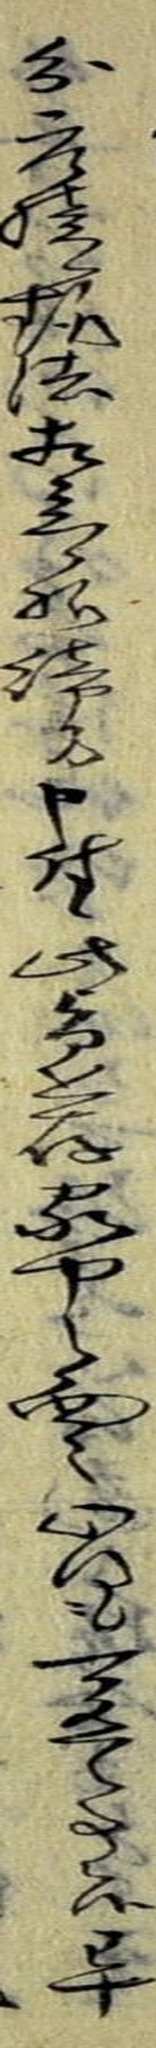分取続候趣法相立候様締方申付候此旨を存家中之面々心得も可有之事ニ候畢
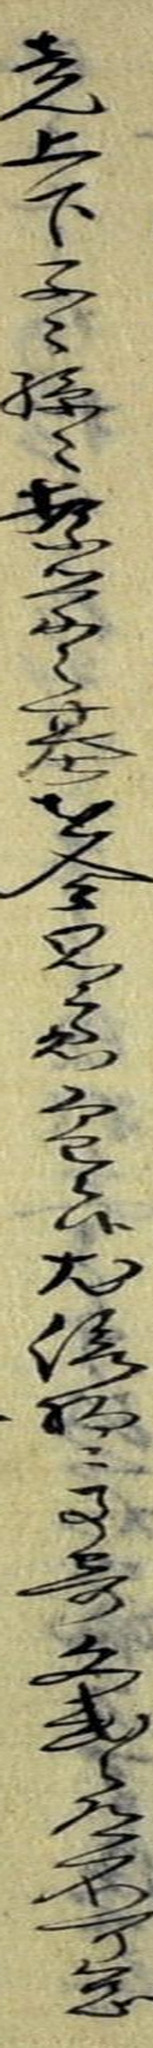竟上下子々孫々繁栄之基を令思慮而已ニ候尤倹約ニ事寄文武之道不可怠
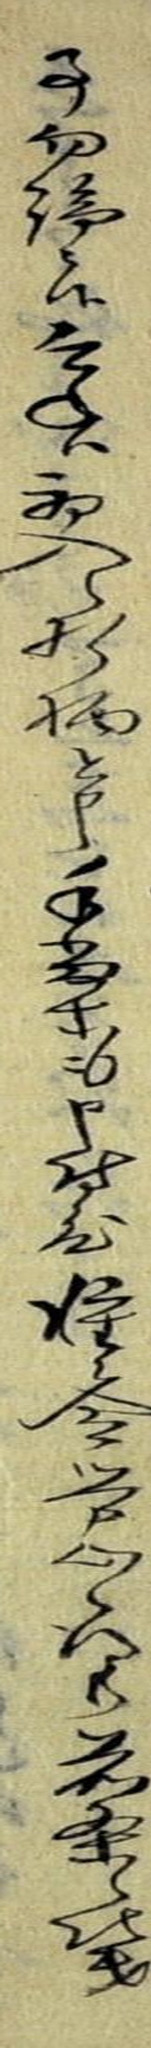事勿論ニ候今年ハ初入之折柄と手当等も申付度種々令労心候得共前条之次第
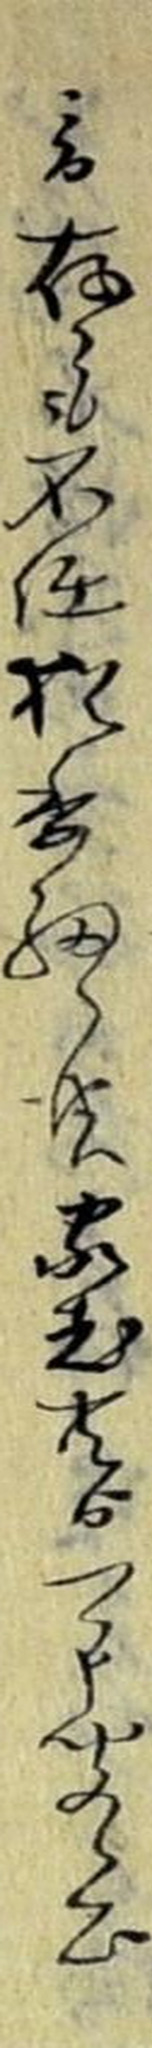ニ而存候も不任猶委細之儀ハ家老共ゟ可申聞候以上
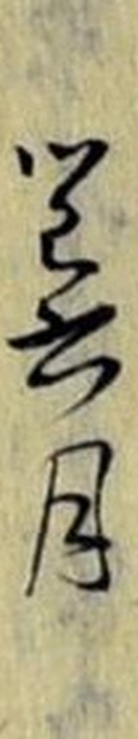閏六月
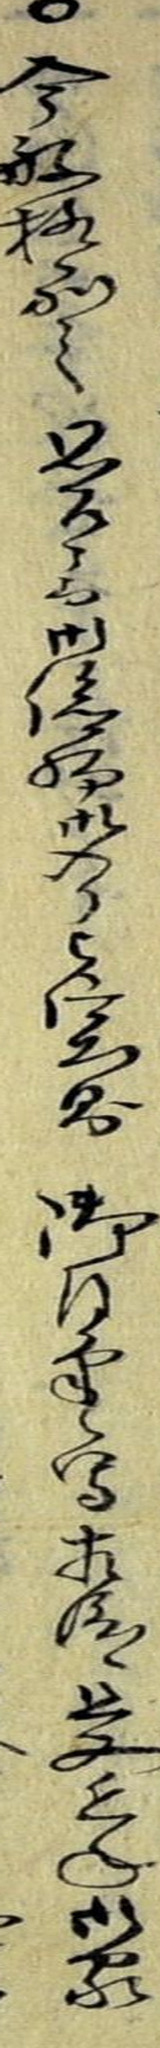○今般格別之思召ニ而御倹約御〆り被仰出則御自筆之写相渡候且又近年御家
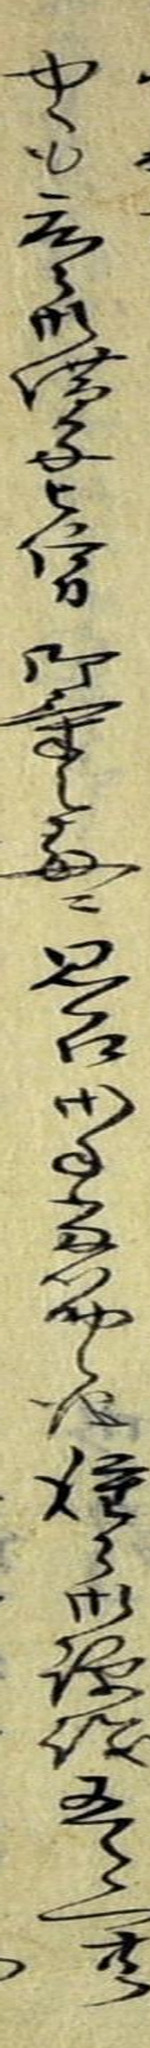中へも度々御借米被仰付御気之毒ニ思召御手当筋之儀種々御評議有之候へ共
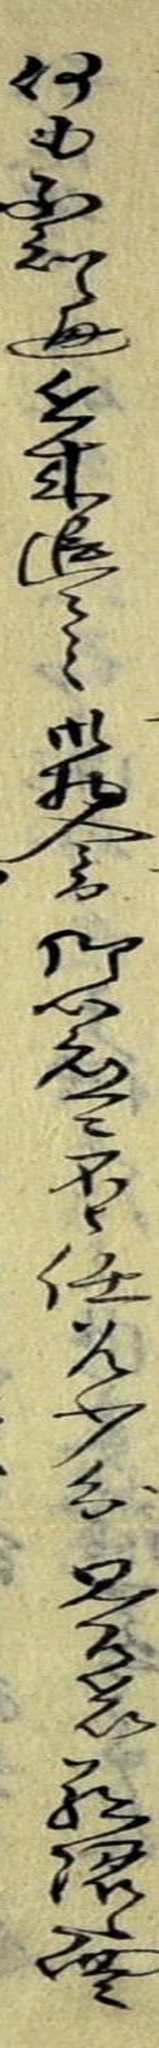何も承知之通近来追々之御物入ニ而御心底ニ不被任乍少分思召を以難渋之面々
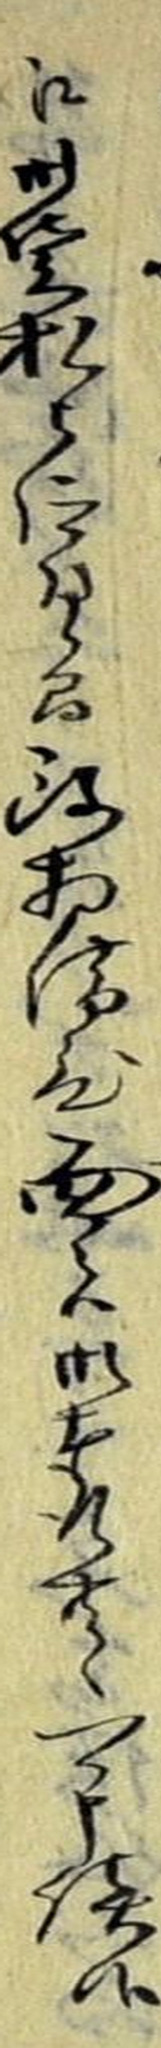江御貸札被仰付候間致相借度面々ハ御奉行共へ可申談候
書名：命令之部 五
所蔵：福井県文書館 Fukui Prefectural Archives
